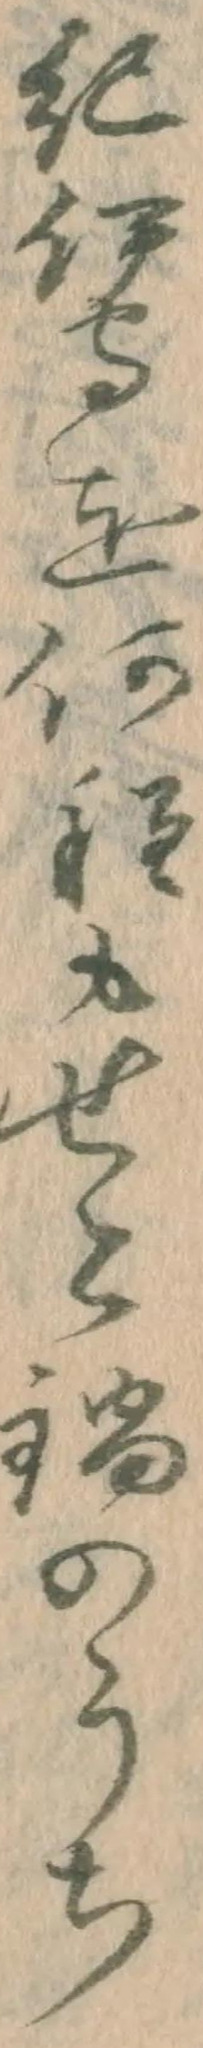紀伊守を何程もせと鍋のうち
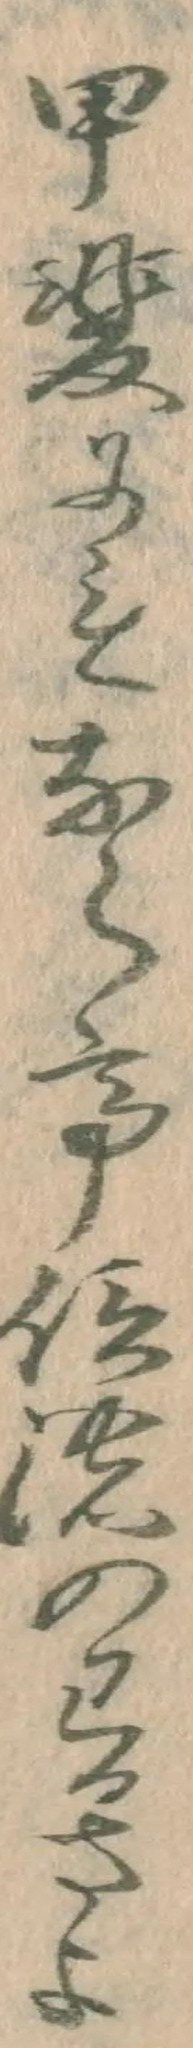甲斐尓もなら亭信濃の已るさよ
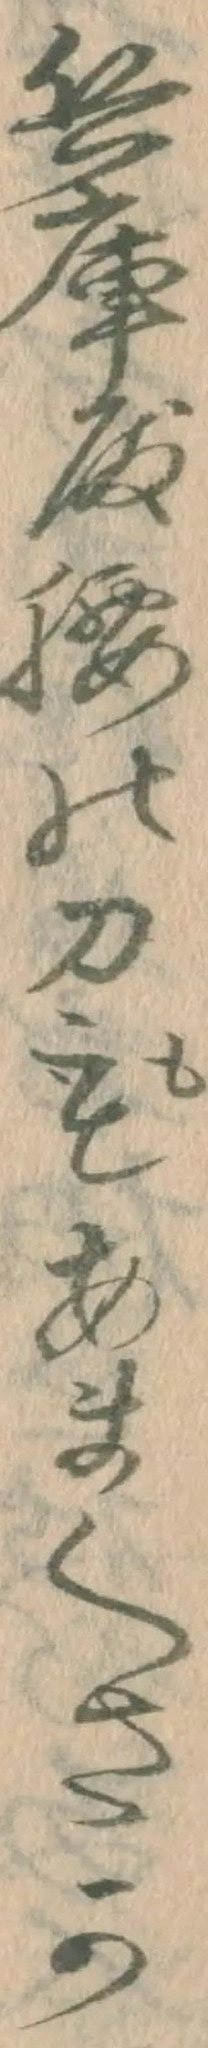兵庫殿腰能刀もあまくさ可
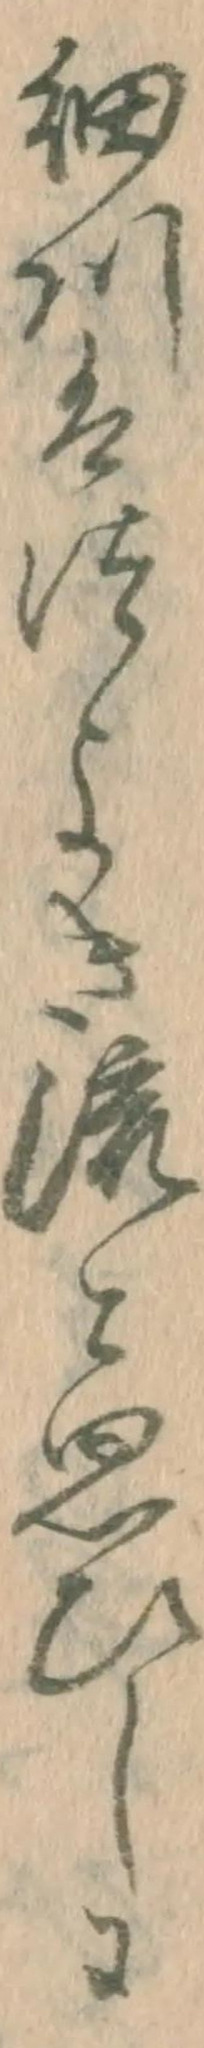細川盤徒よき流と思ひし尓

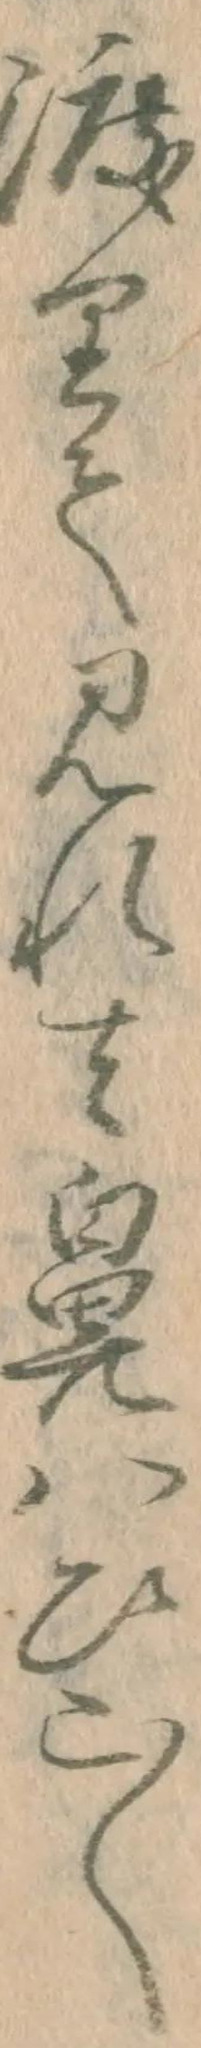渡里て見れ者鼻はひく〳〵
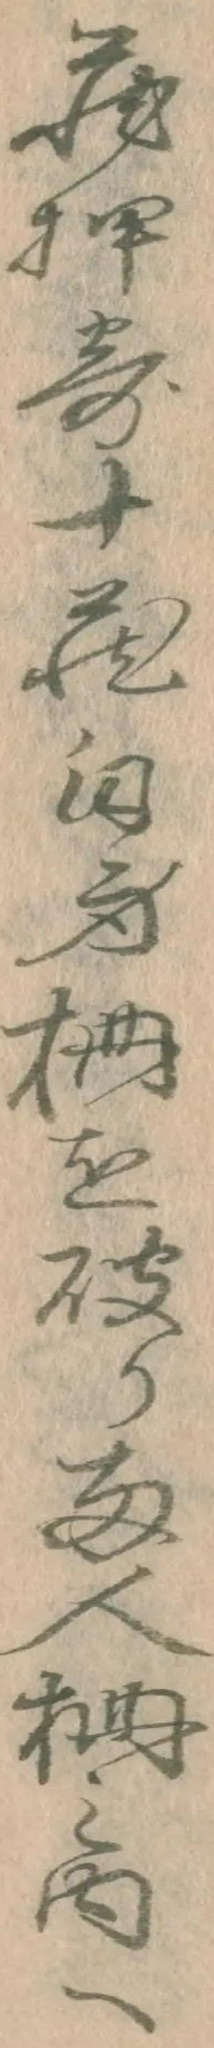蔵押寄十蔵自身柵を破り両人柵之内へ
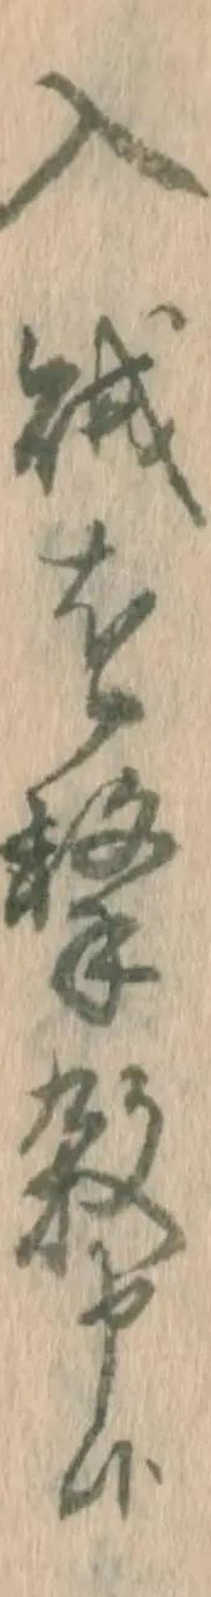入賊を撃殺申候
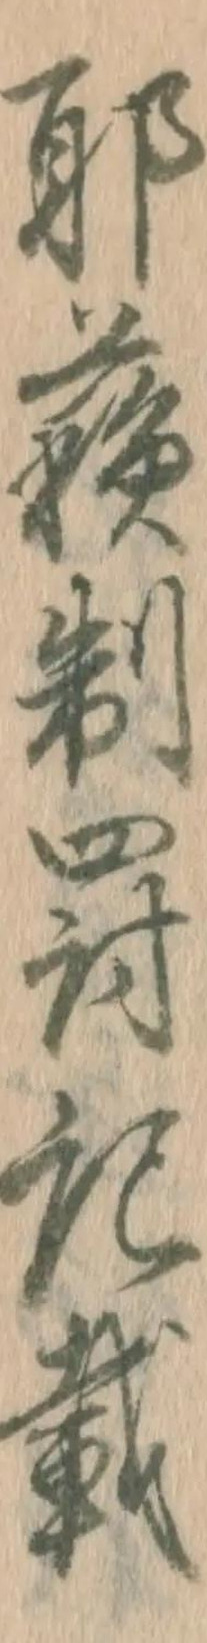耶蘇制罸記載
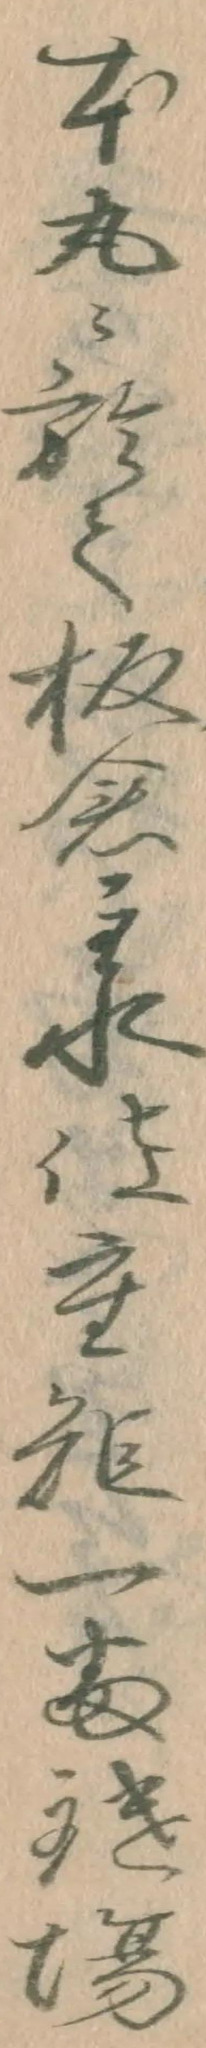本丸に於て板倉主水佐重矩一番鑓場
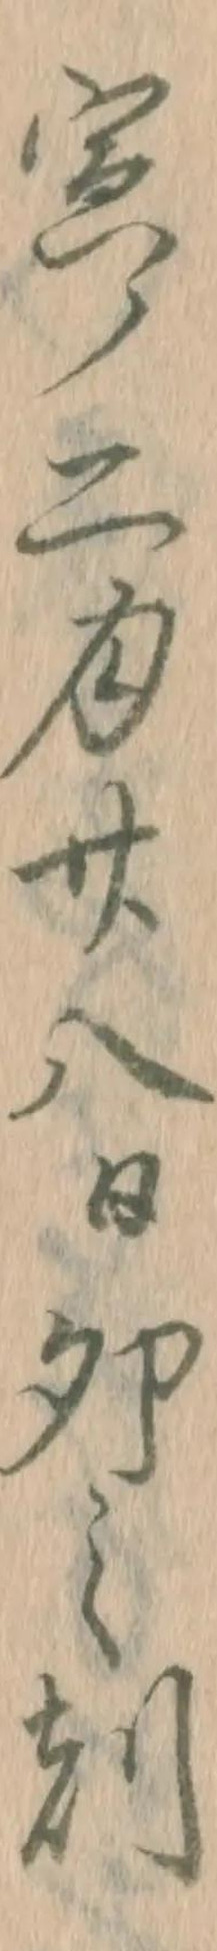寅之二月廿八日夘之刻
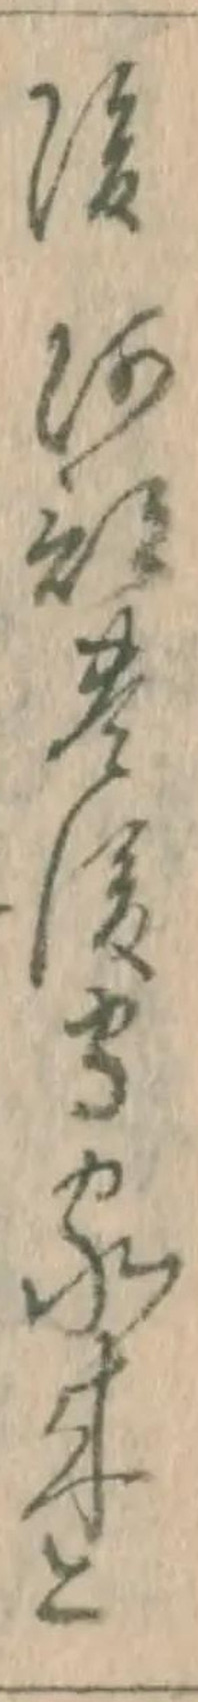後阿部豊後守家来と

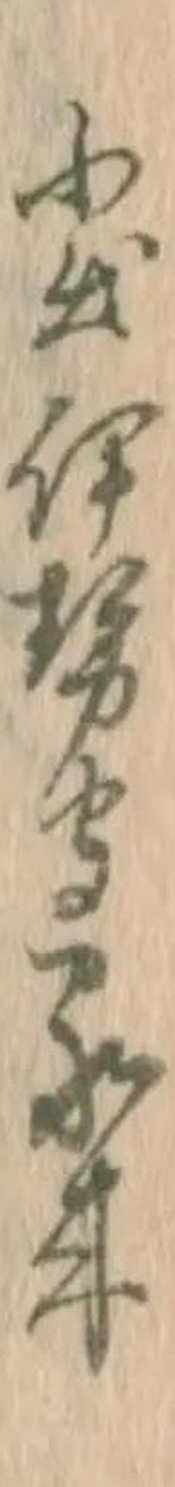小出伊勢守家来
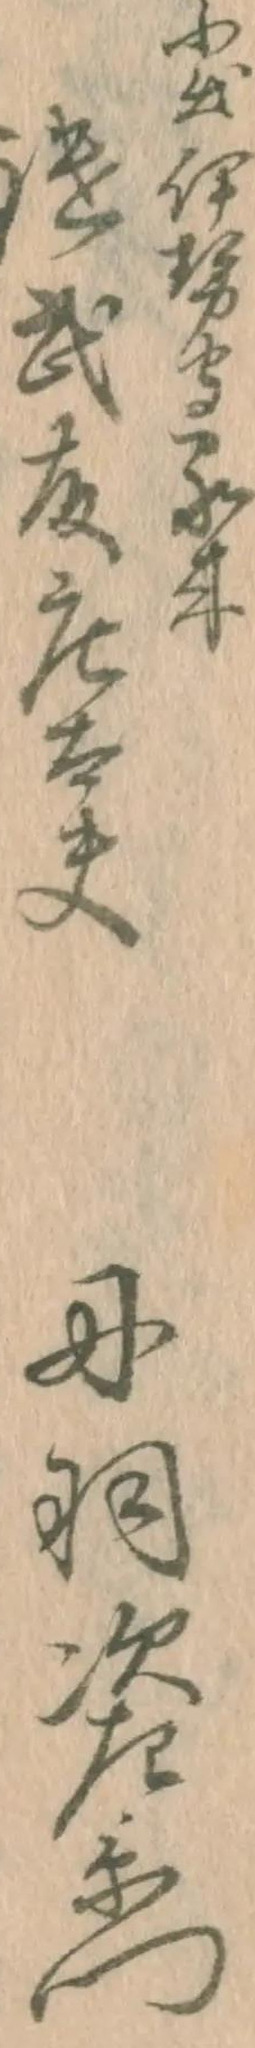∵鑓武藤庄太夫丹羽次左衛門
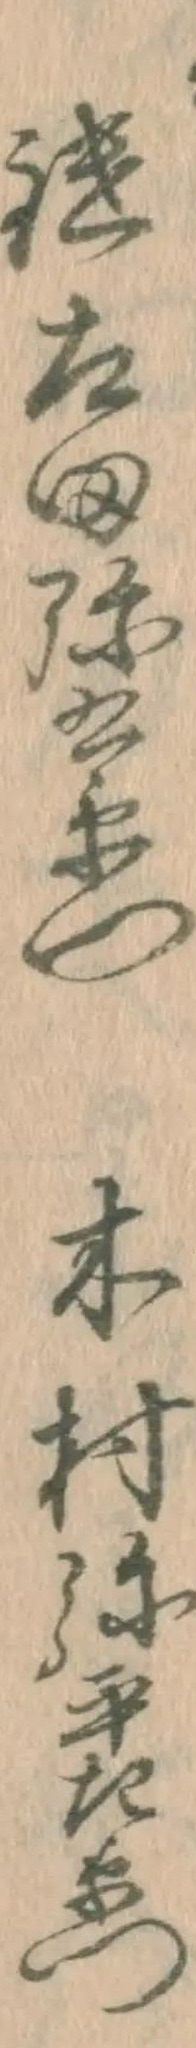∵鑓太田弥右衛門木村弥平左衛門
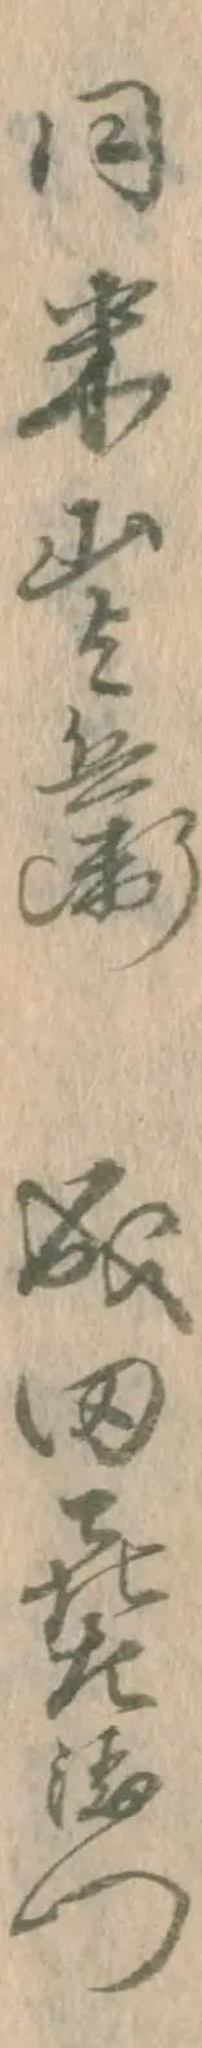∵同米山与兵衛成田喜左衛門
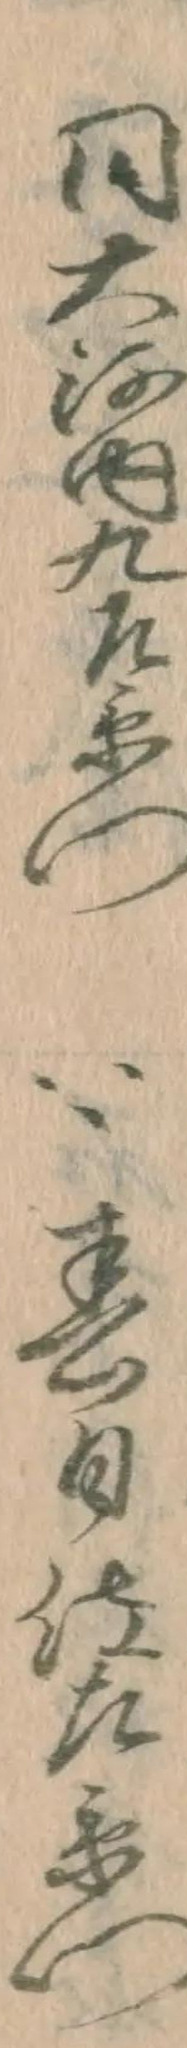∵同大河内九左衛門∵春日佐左衛門
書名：切支丹御退治記 49巻. [8]
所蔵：国立国会図書館 National Diet Library, JAPAN
